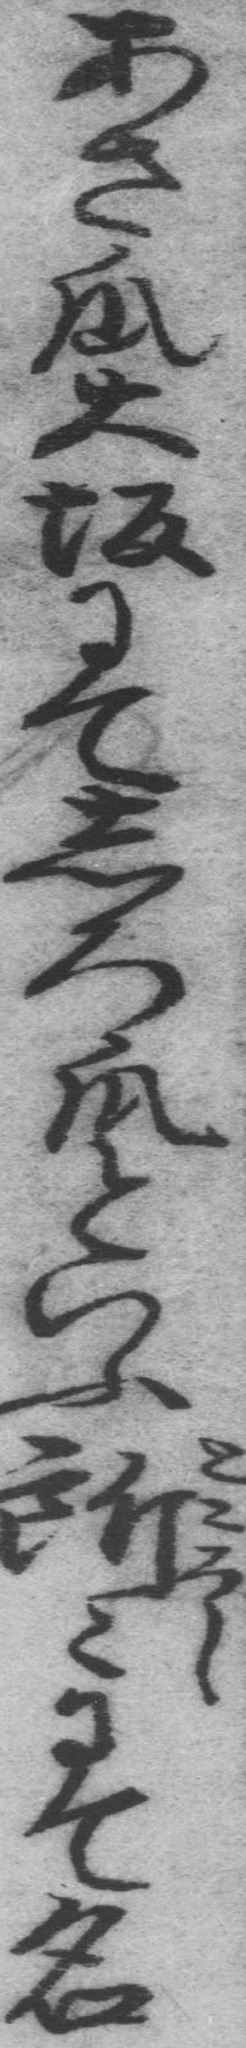あさ瓜大坂にてしろ瓜といふ所々にて名
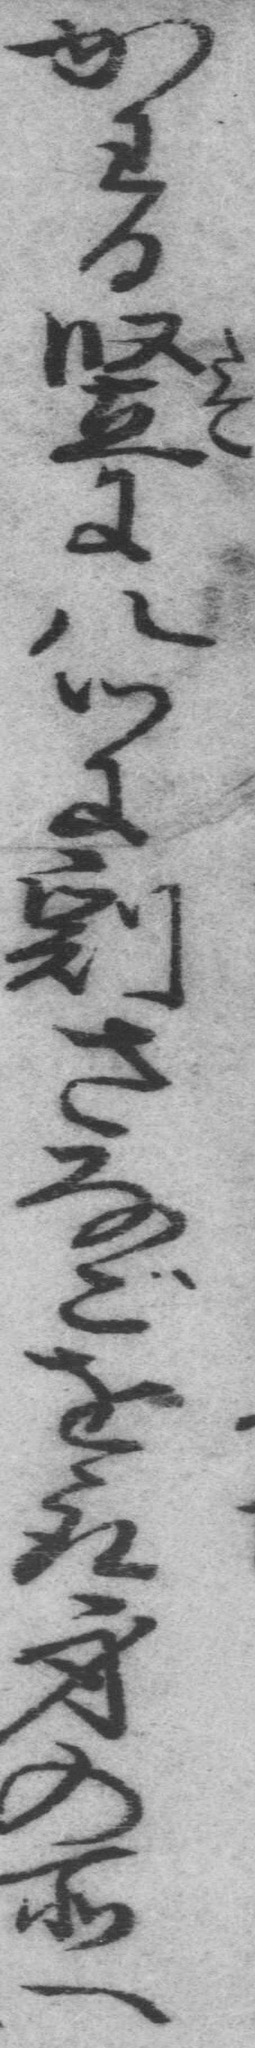かわる竪に八ツに割さなごを取身の所へ
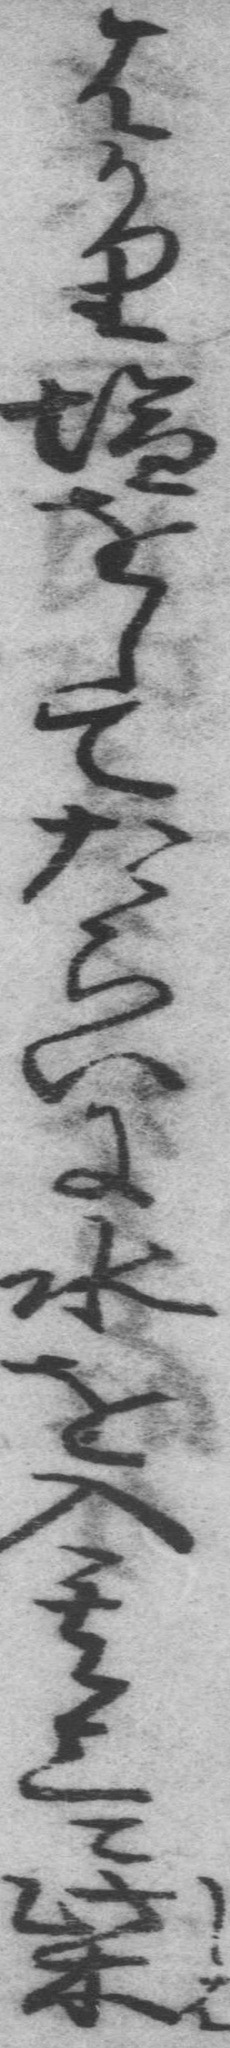はかり塩をしてたらいに水を入其上に柴
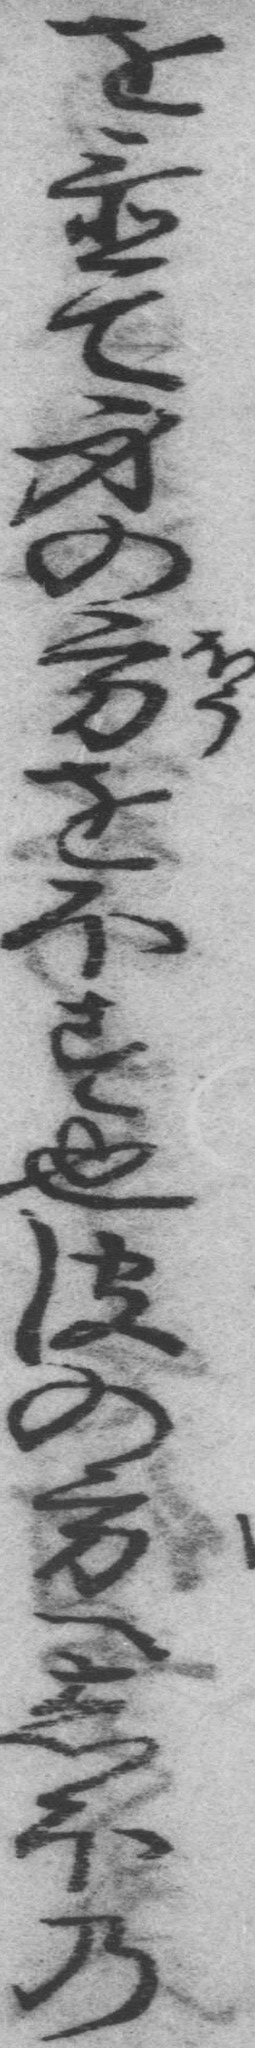を置て身の方をほす也皮の方へしほの
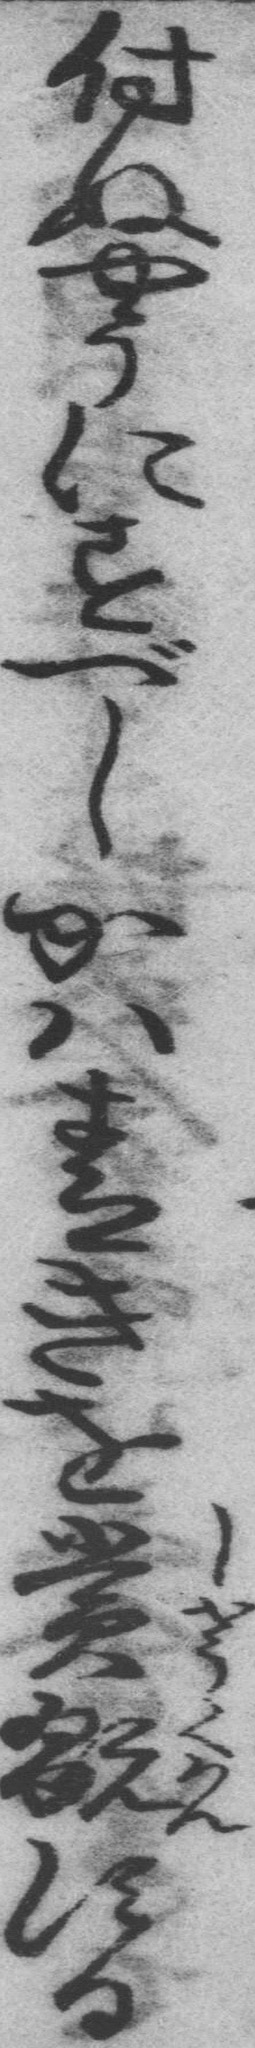付ぬやうにすべしかは青きを賞翫する
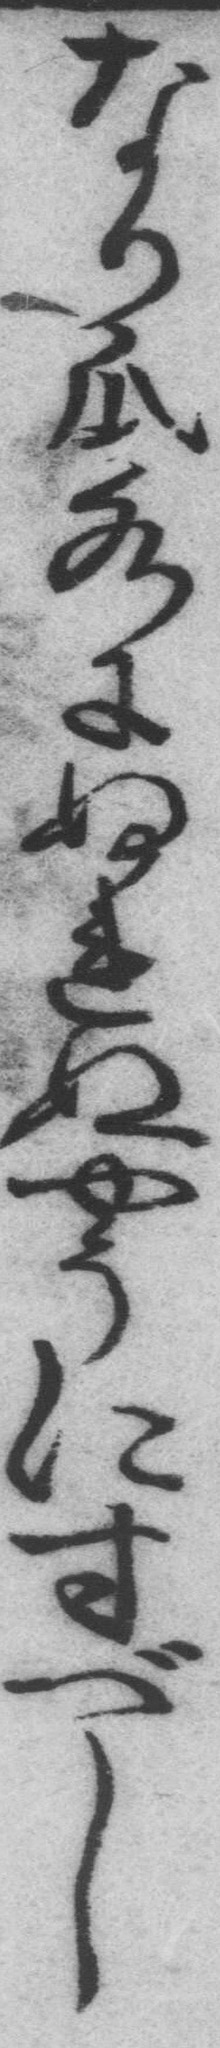なり瓜水にぬれぬやうにすべし
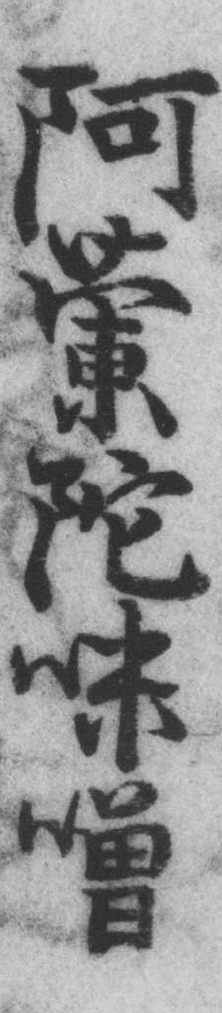阿蘭陀味噌
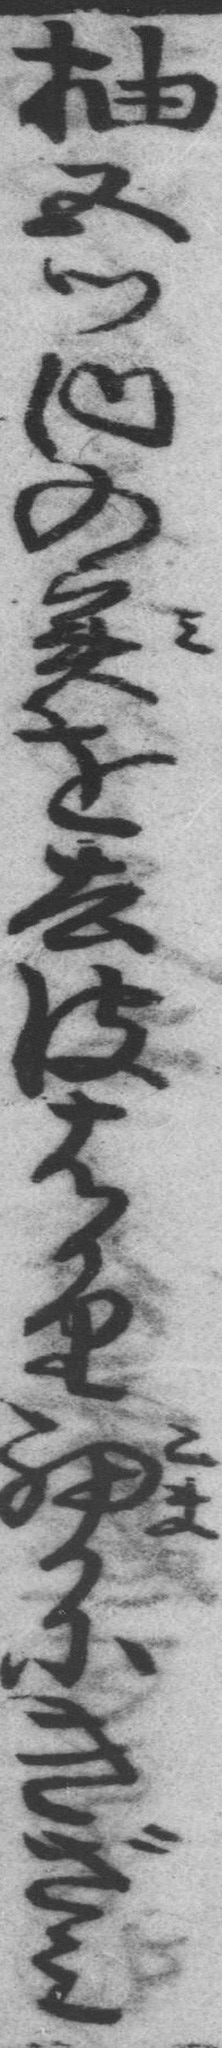柚五ツ内の実を去皮はかり細かにきざみ
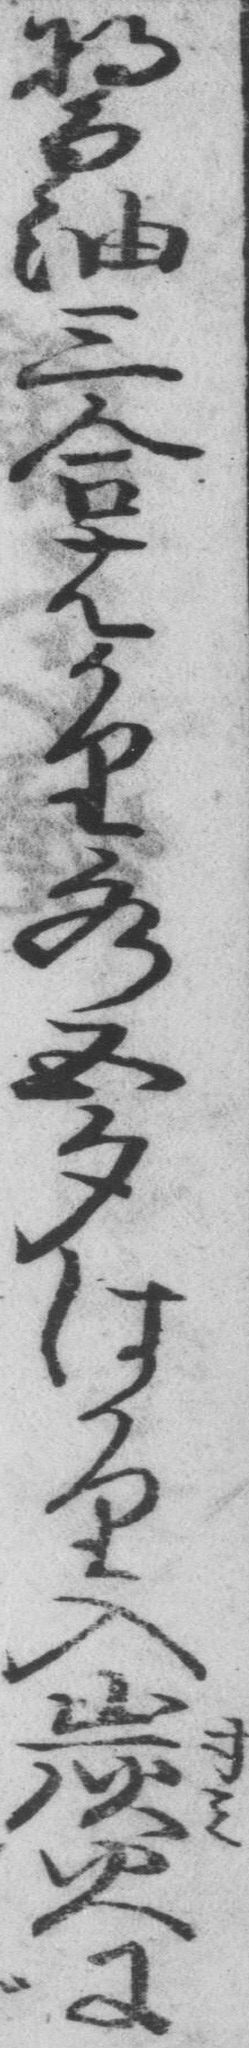醤油三合はかり水五勺はかり入炭火に
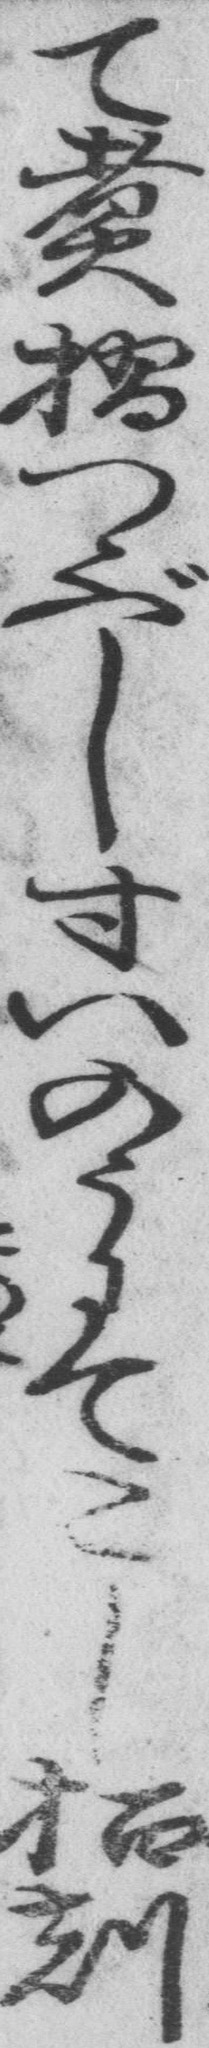て煮摺つぶしすいのうにてこし柏刻
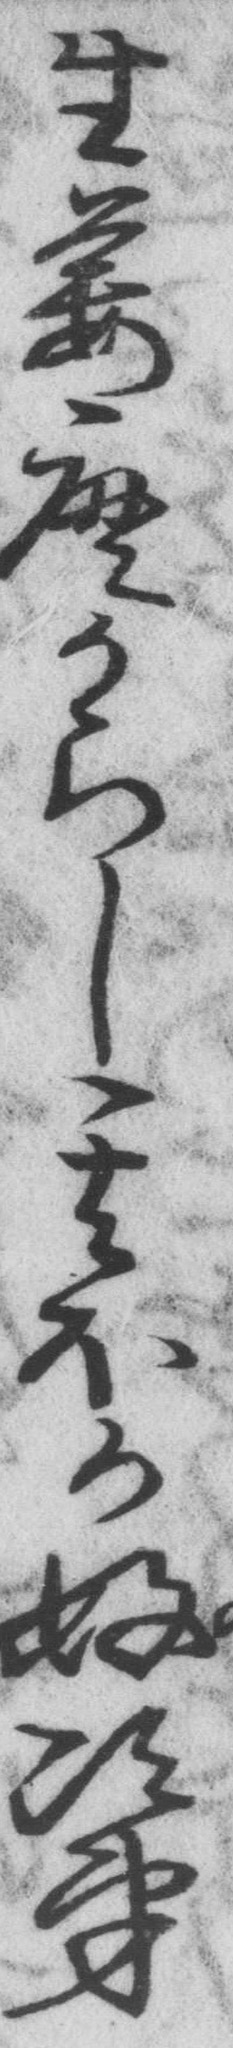生姜唐からし其ほか好次第
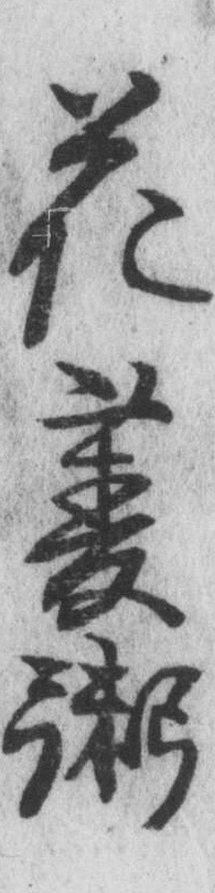花菱粥
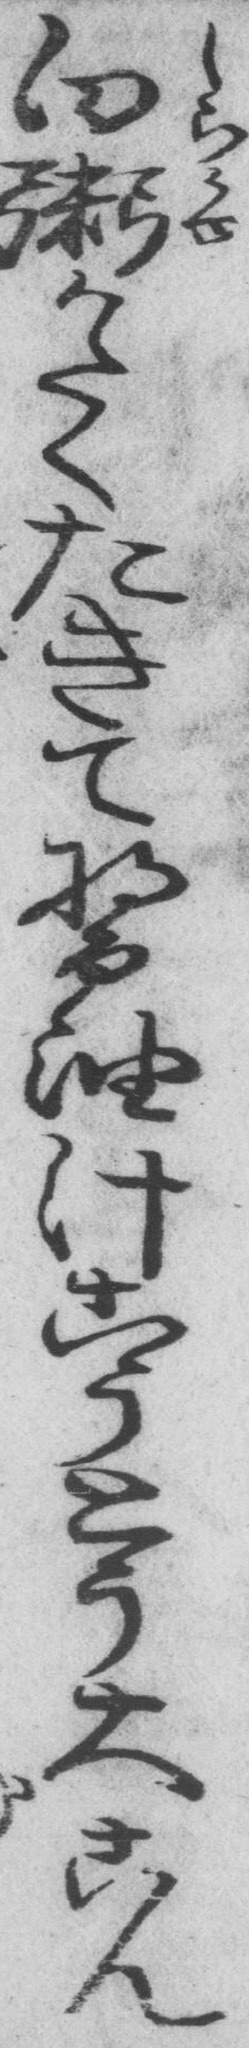白粥かたくたきて醤油汁こうとう大こん
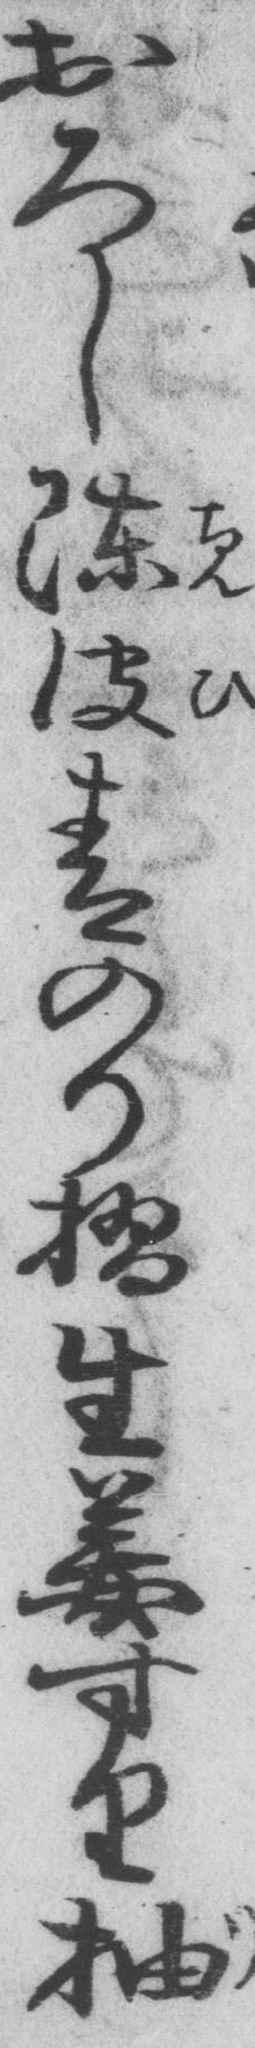おろし陳皮青のり摺生姜すり柚
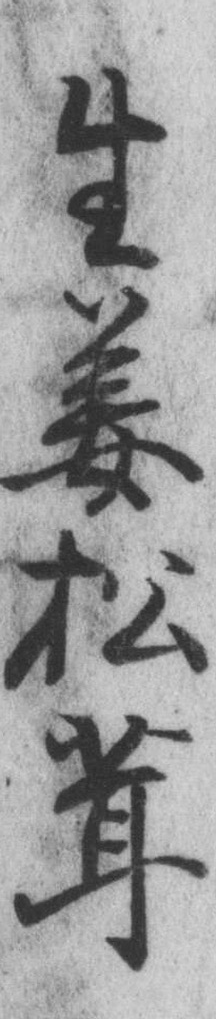生姜松茸

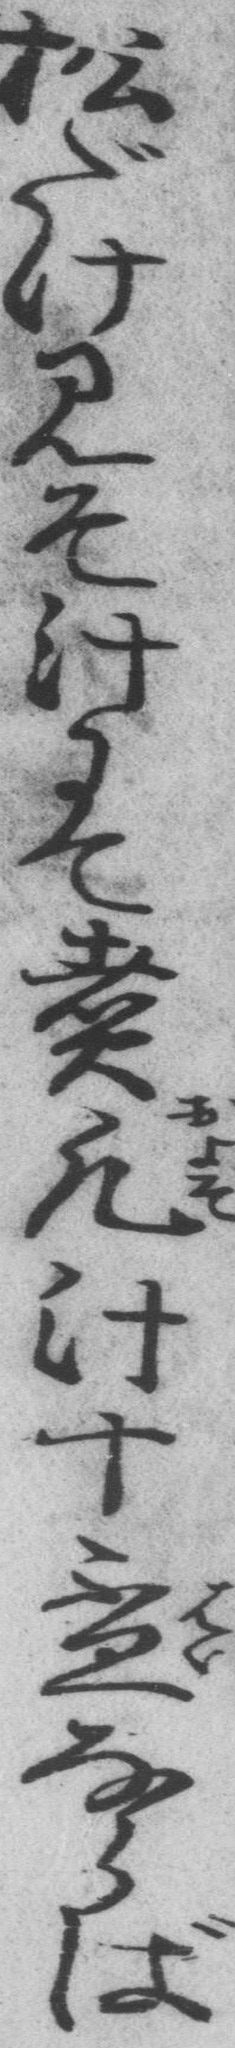松だけみそ汁にて煮凡汁十盃ならば
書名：料理山海郷
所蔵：大阪府立大学学術情報センター 国文学研究資料館
